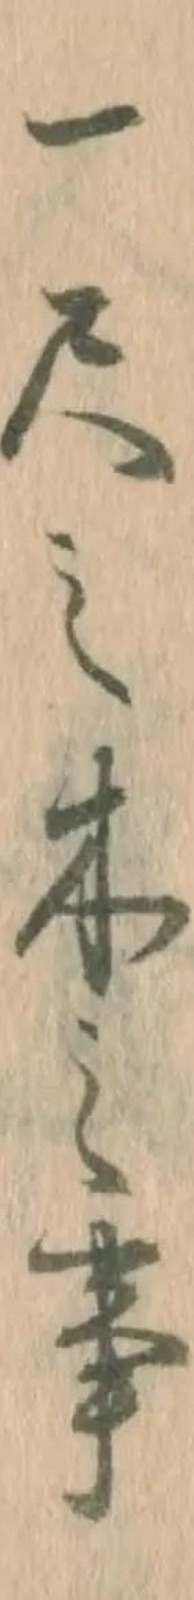一尺之木之事
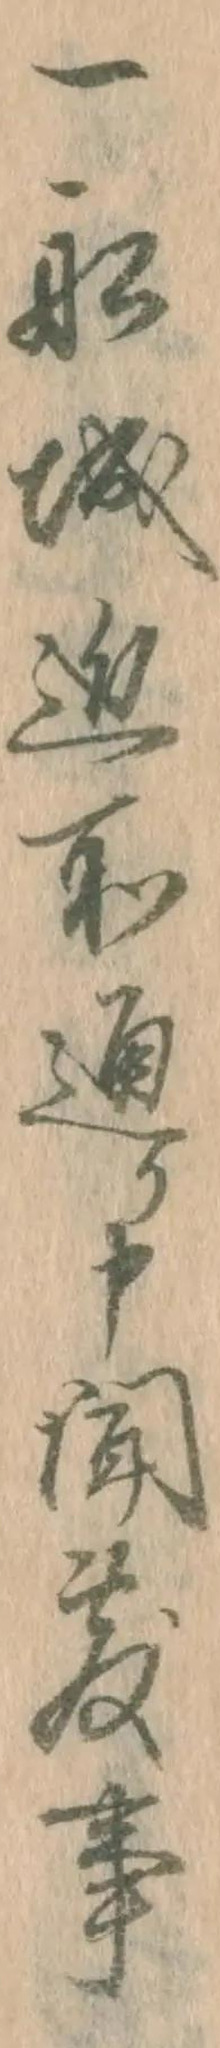一舩城近所通り申聞敷事
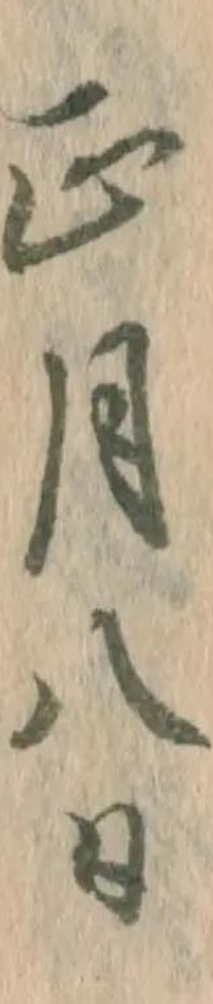正月八日
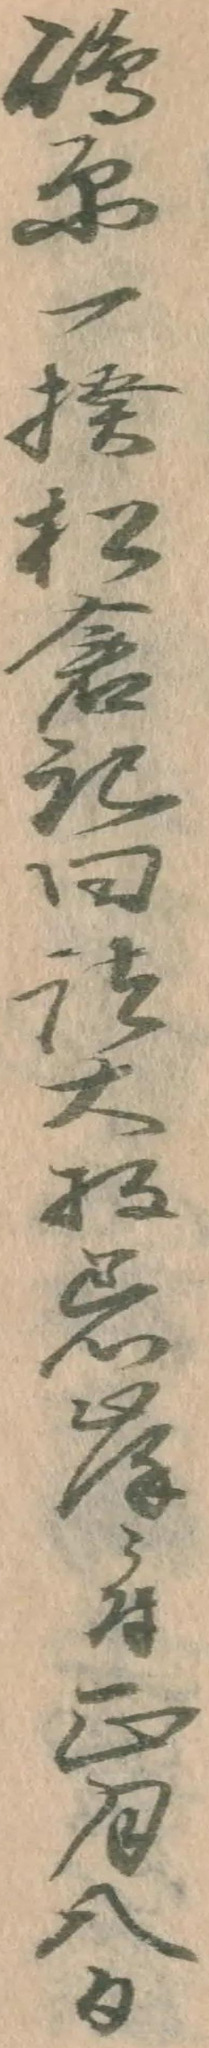島原一揆松倉記曰諸大将着岸に付正月八日
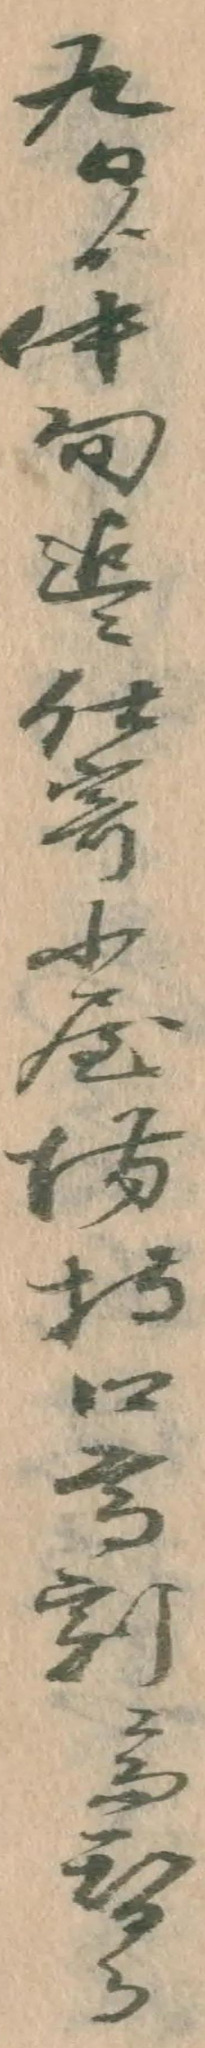九日ゟ中旬迄に仕寄小屋場持口高割に而替る
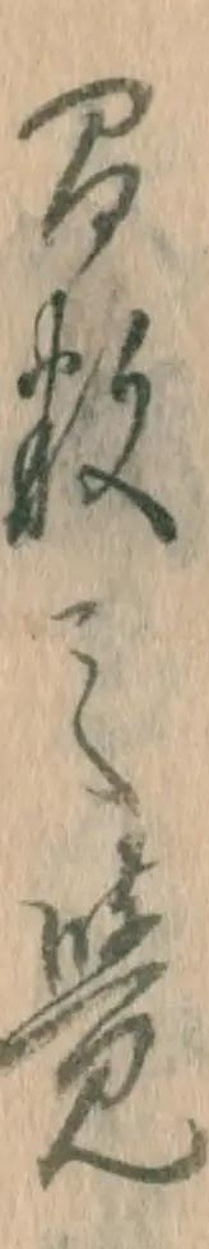間数之覚
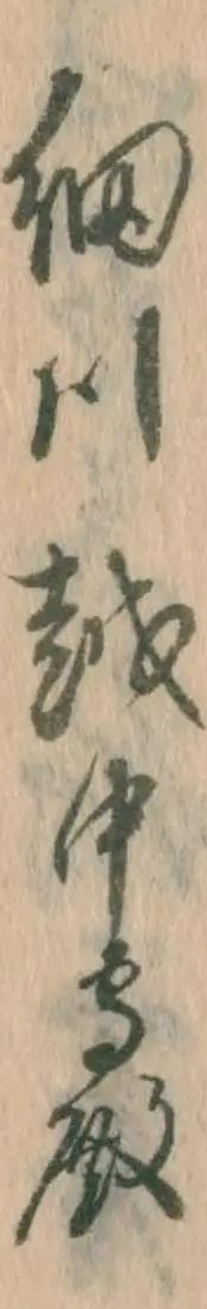細川越中守様
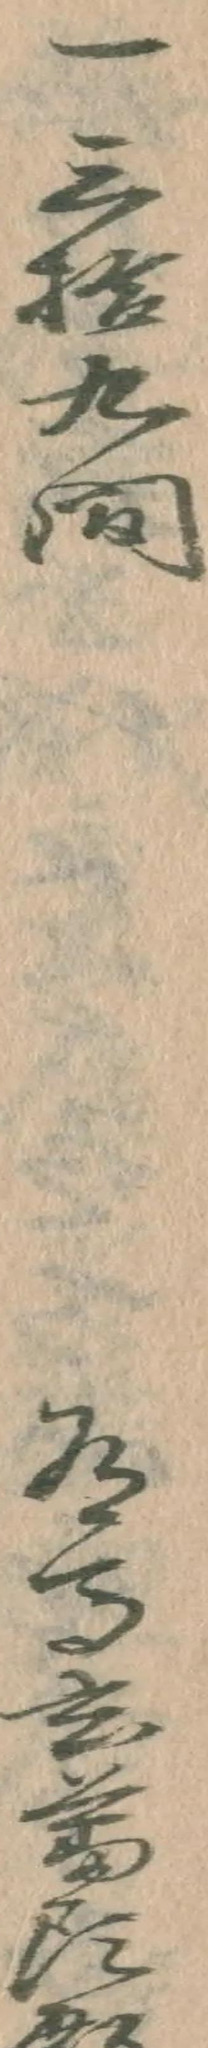一三拾九間有馬玄蕃殿
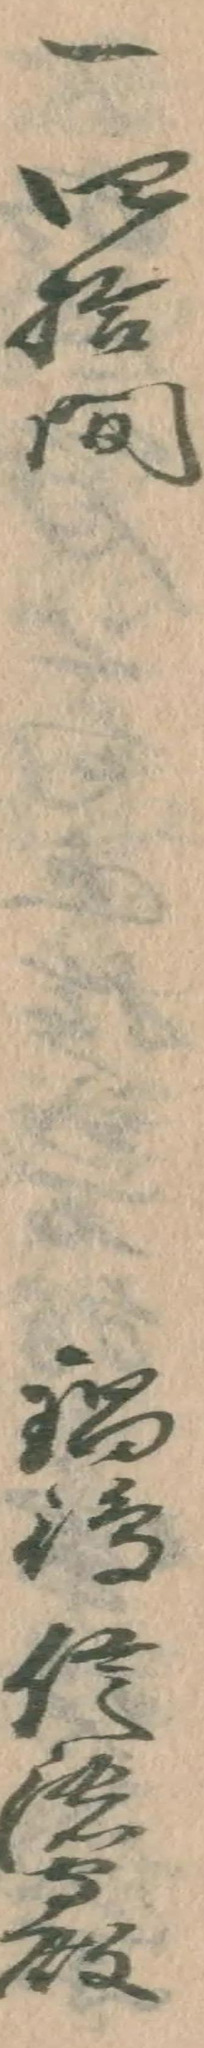一四拾間鍋島信濃守様
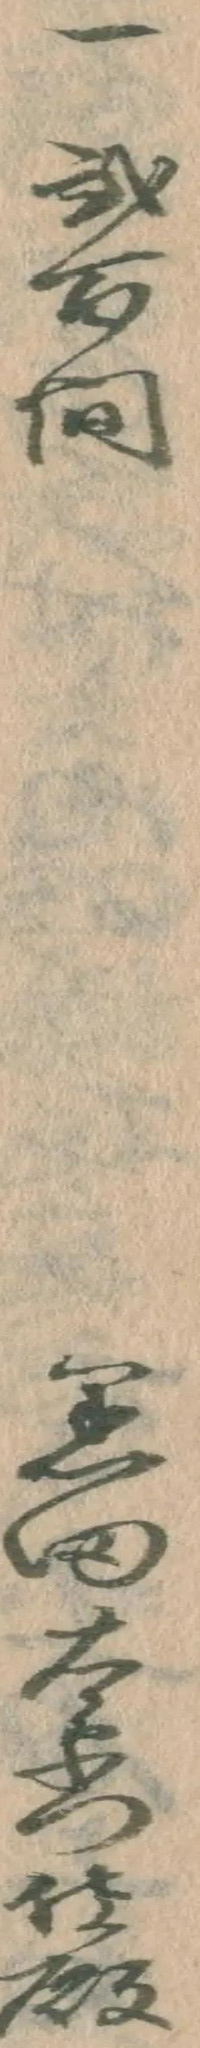一弐百間黒田右衛門佐殿
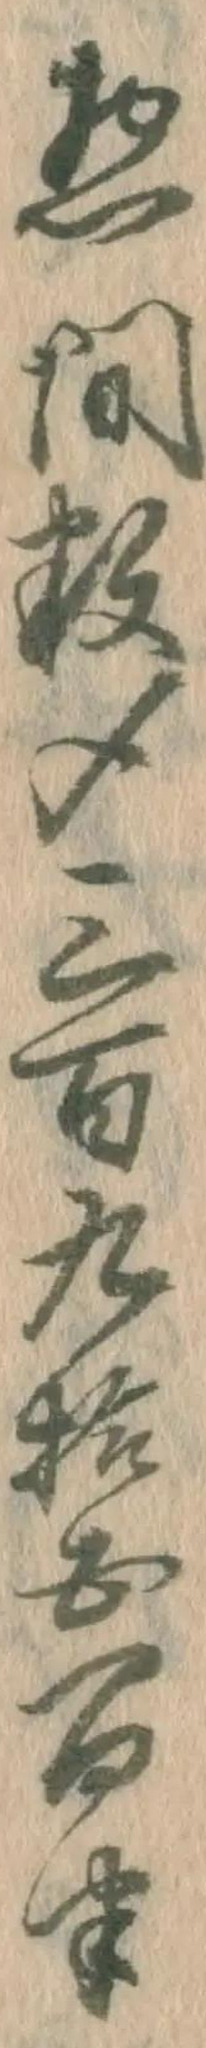惣間数〆三百九拾五間半
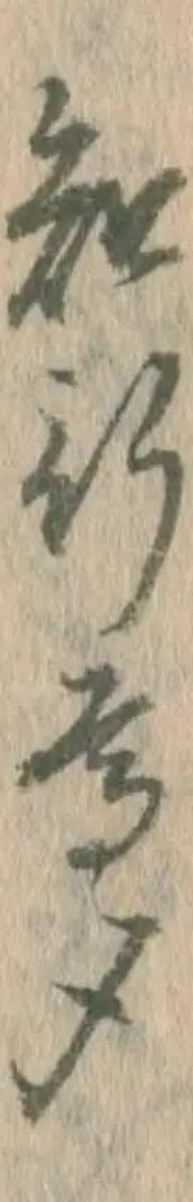知行高〆
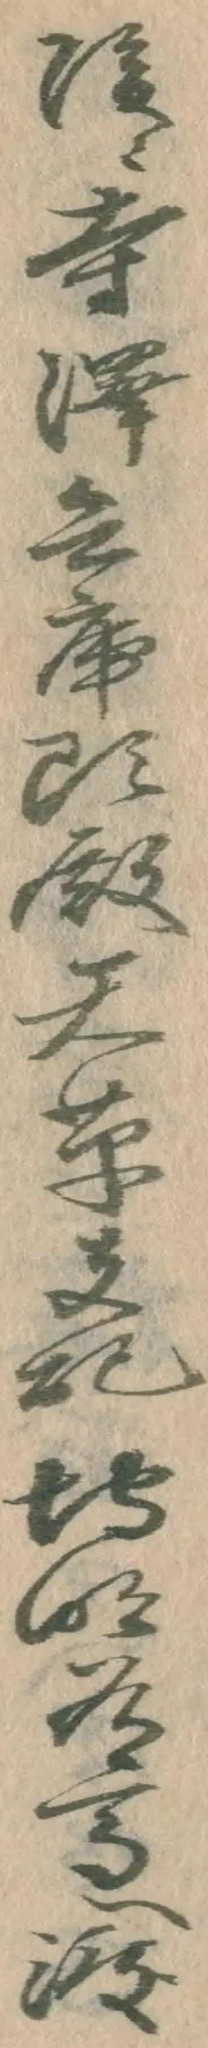後に寺沢兵庫頭殿天草支配埒明有馬へ渡
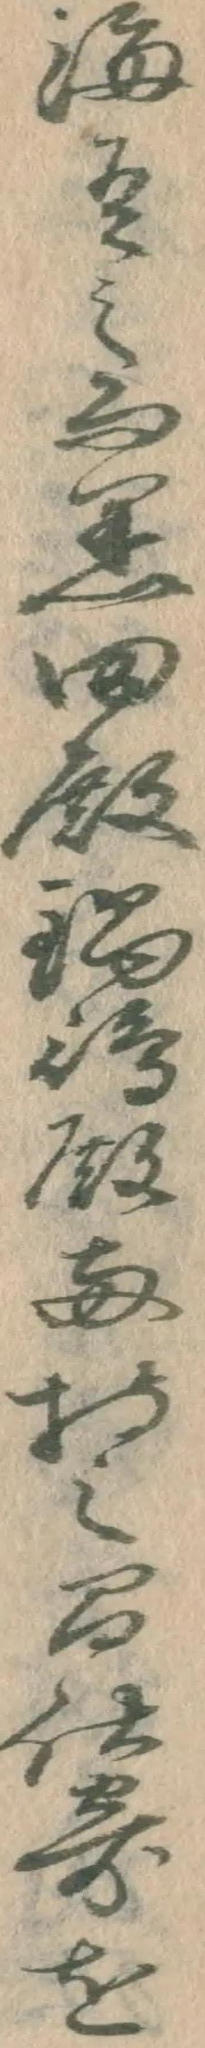海有之而黒田殿鍋島殿両持之間仕寄を
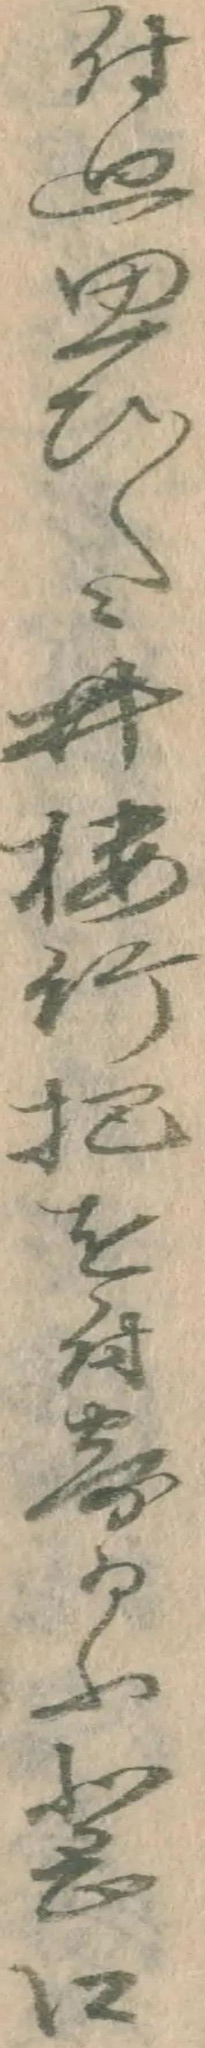付廻思ひ〳〵に井樓竹把を付寄る尓北岡口
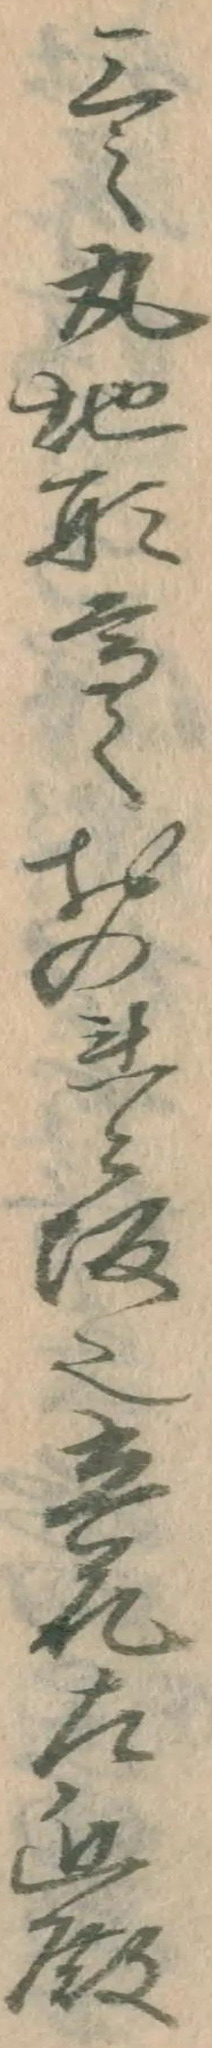三之丸地形高くおの連に坂也立花左近殿
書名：切支丹御退治記 49巻. [5]
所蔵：国立国会図書館 National Diet Library, JAPAN
